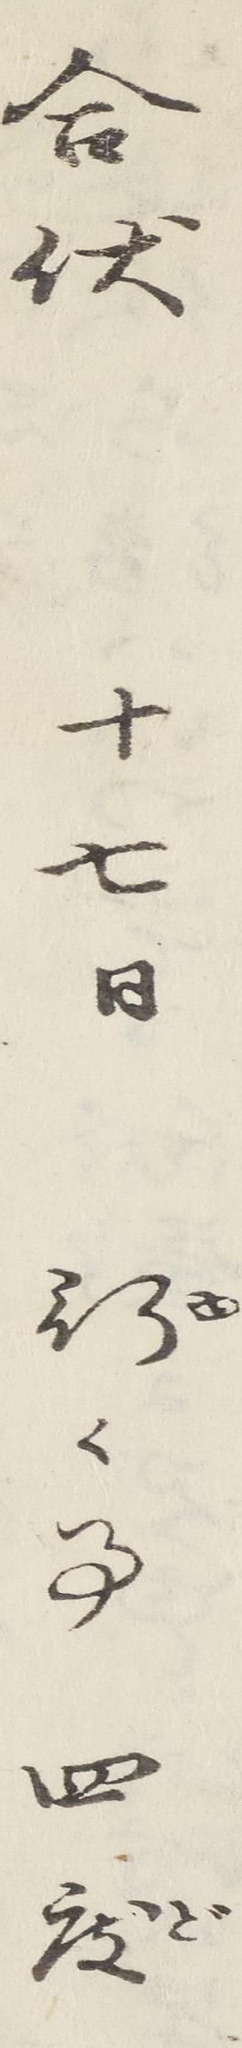合伏十七日行く事四度
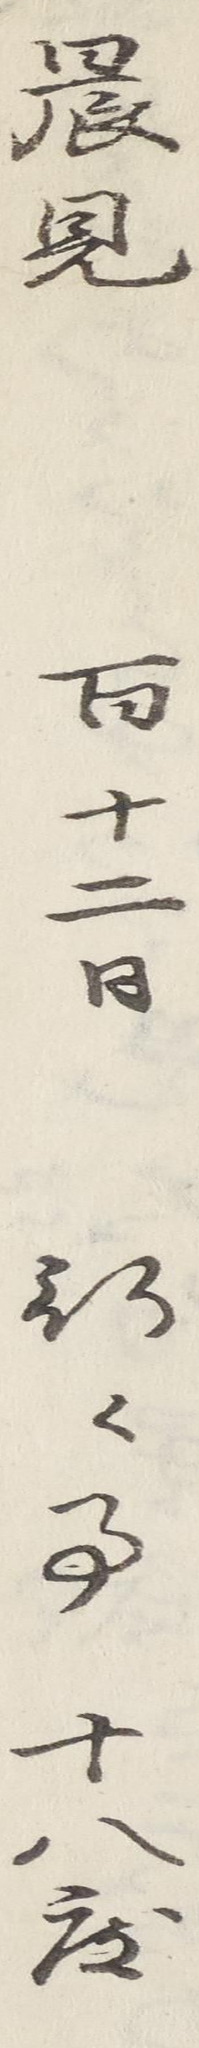晨見百十二日行く事十八度
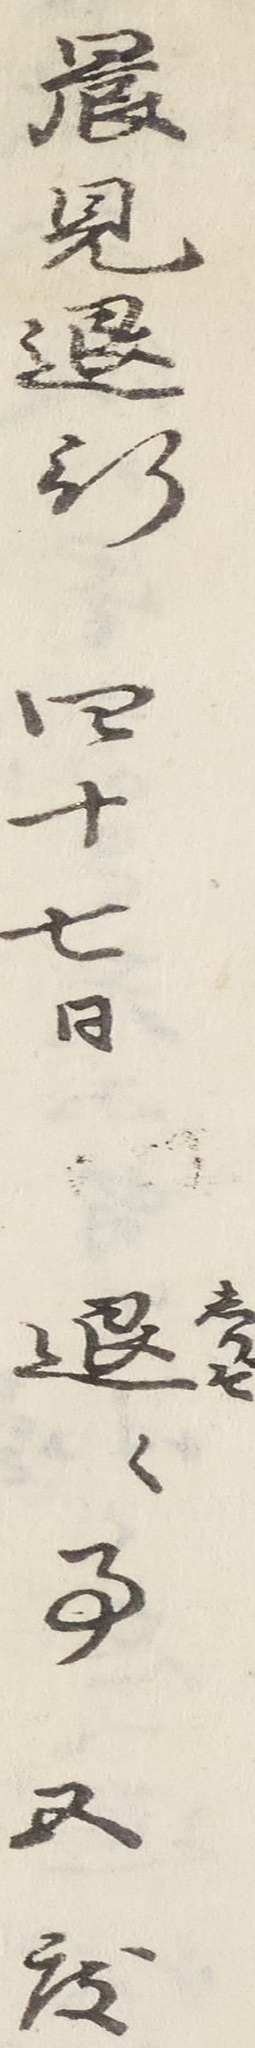晨見退行四十七日退く事五度
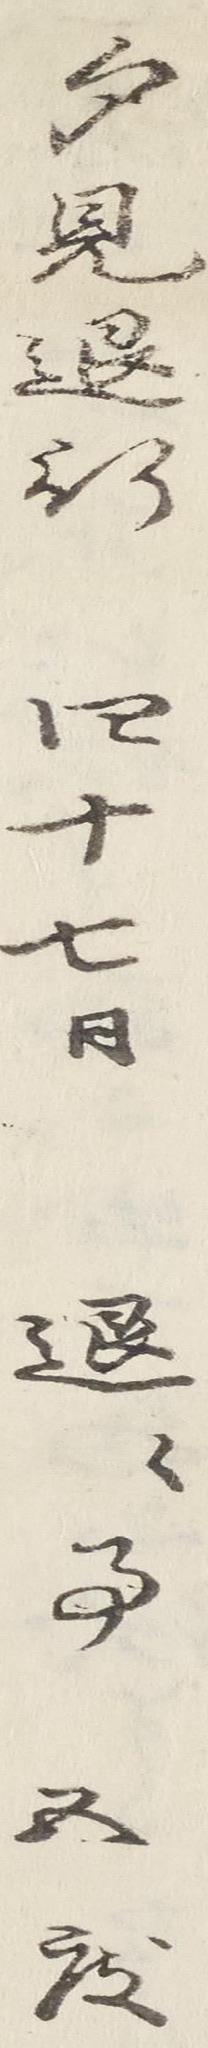夕見退行四十七日退く事五度
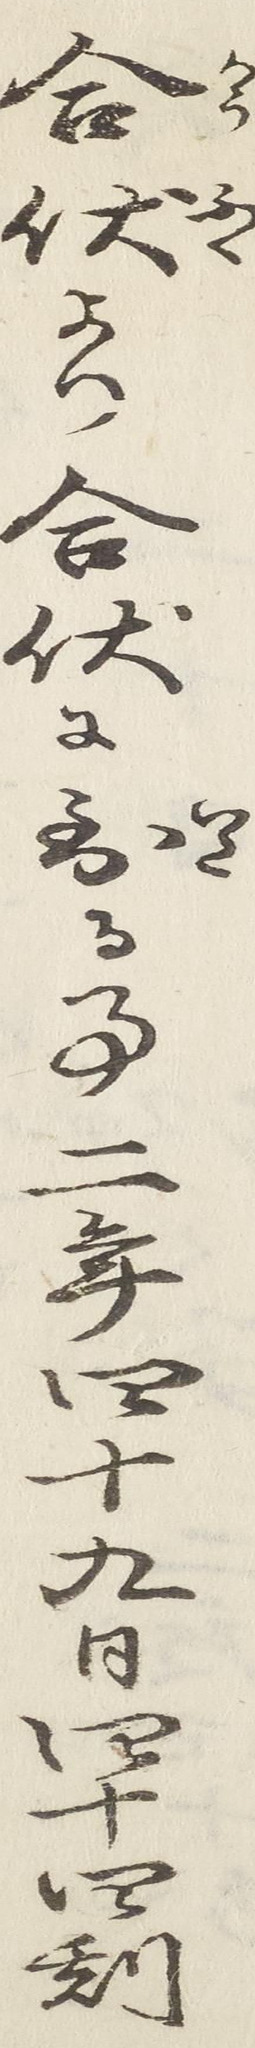合伏より合伏に至る事二年四十九日四十四刻
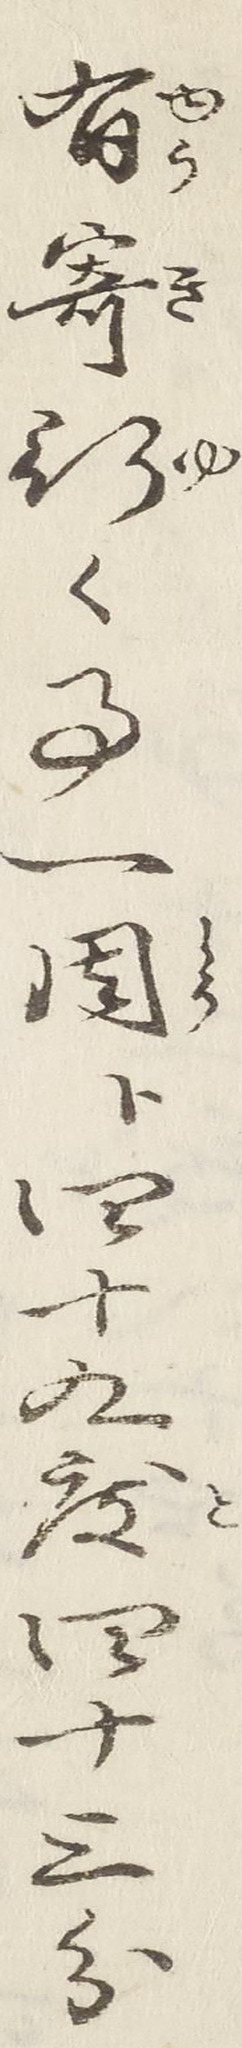有寄行く事一周ト四十九度四十三分
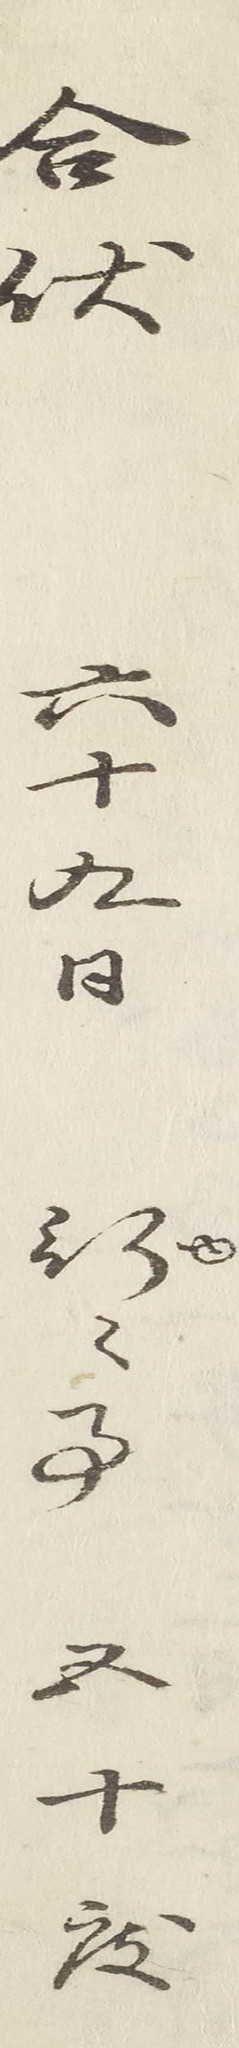合伏六十九日行く事五十度
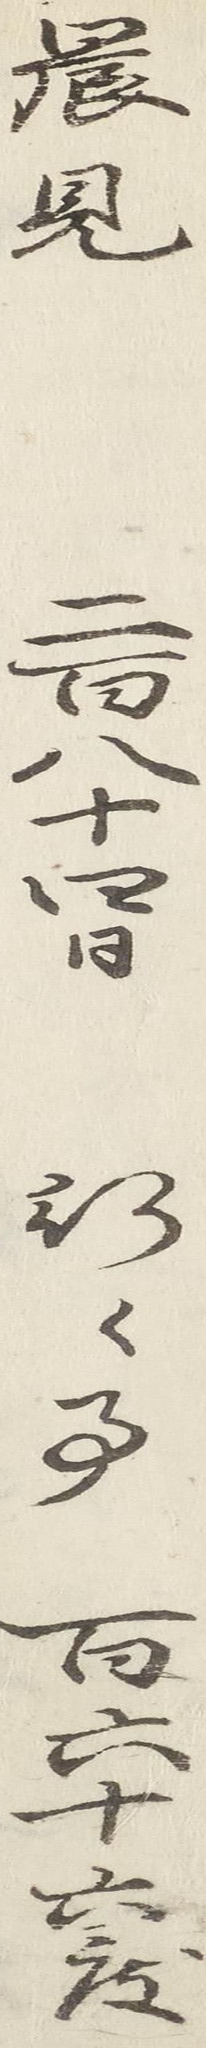晨見二百八十四日行く事百六十六度
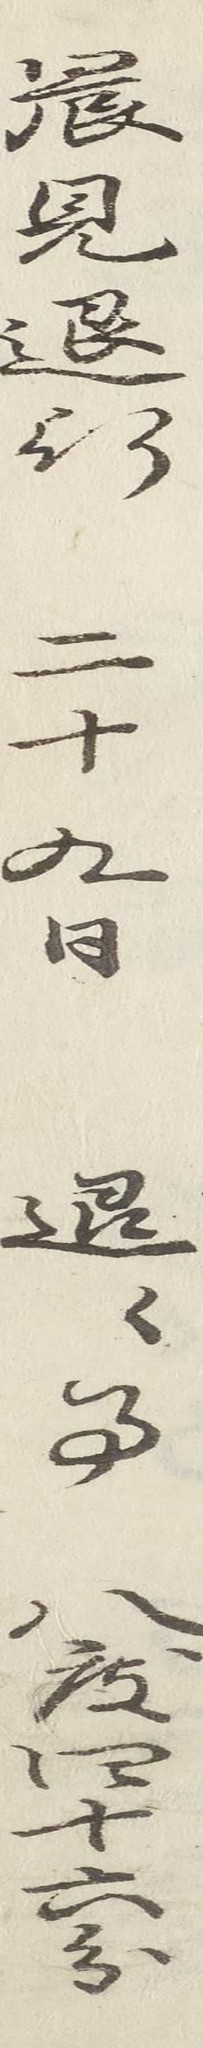晨見退行二十九日退く事八度四十六分

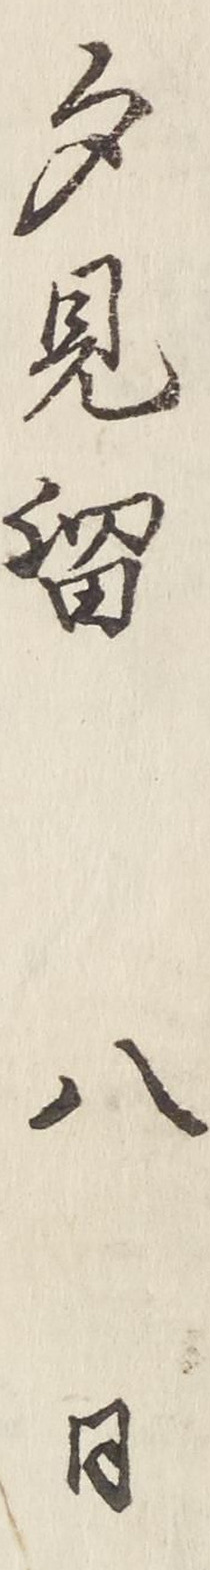夕見留八日
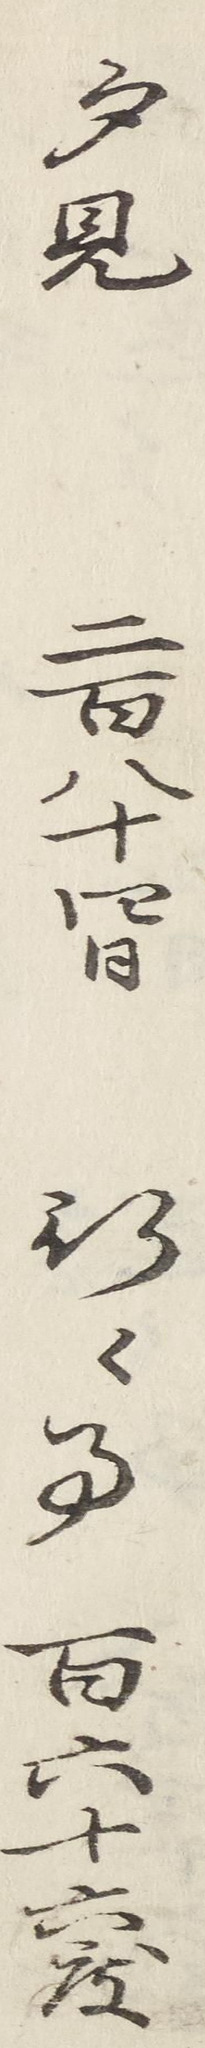夕見二百八十四日行く事百六十六度
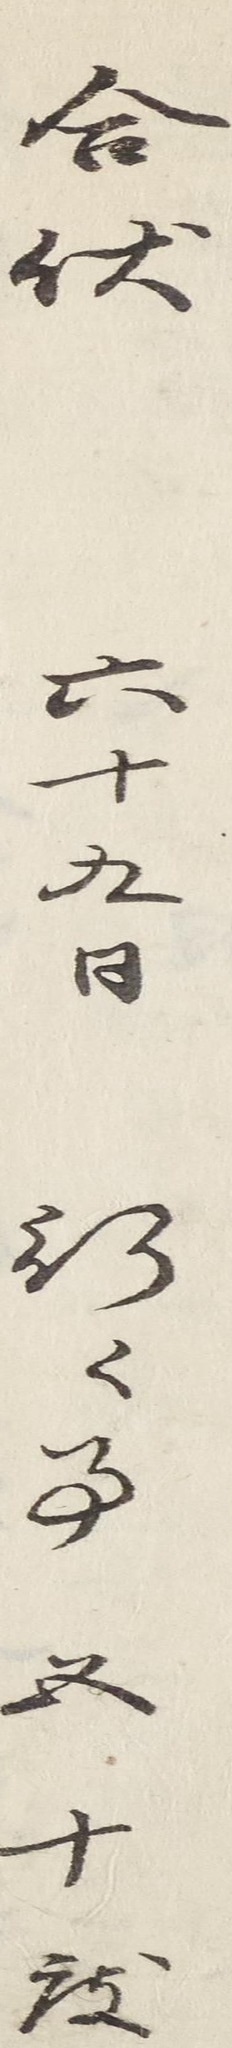合伏六十九日行く事五十度
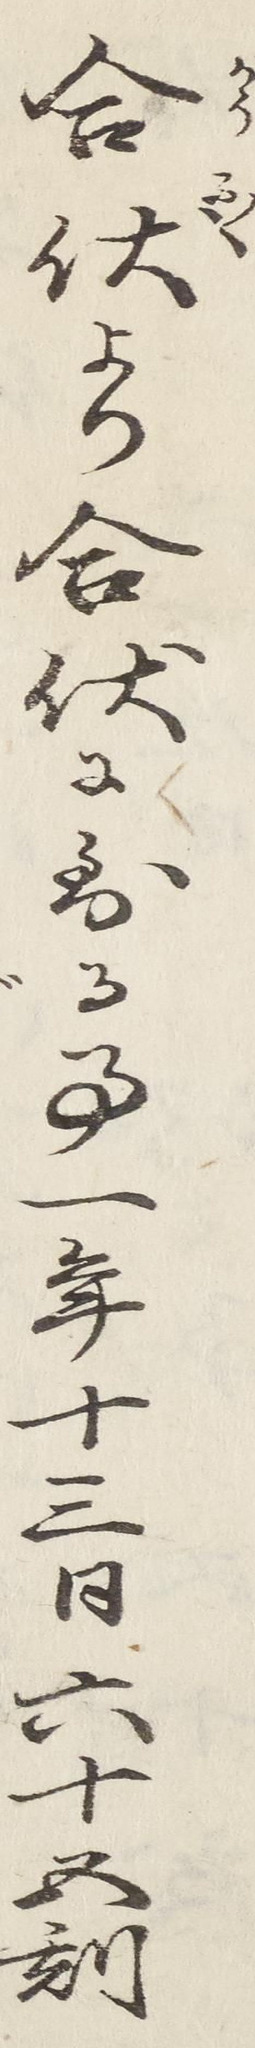合伏より合伏に到る事一年十三日六十五刻
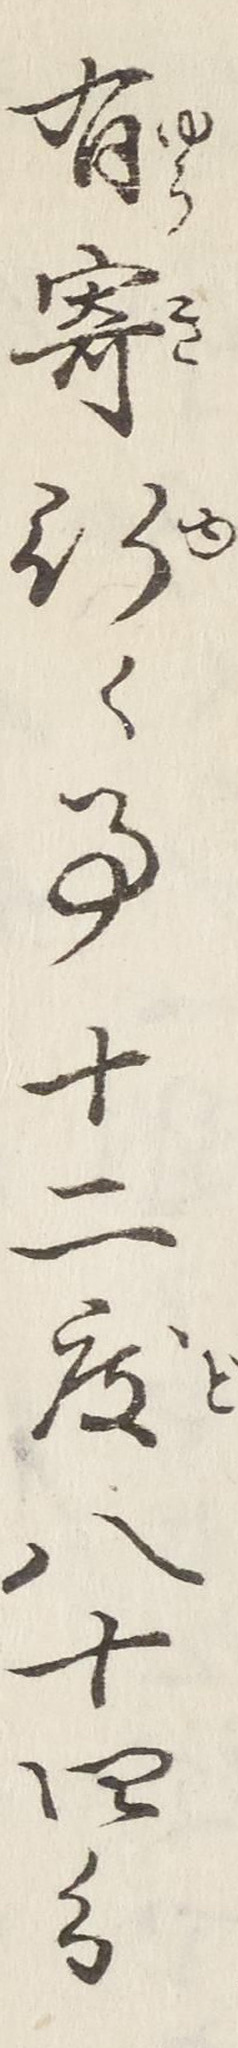有寄行く事十二度八十四分
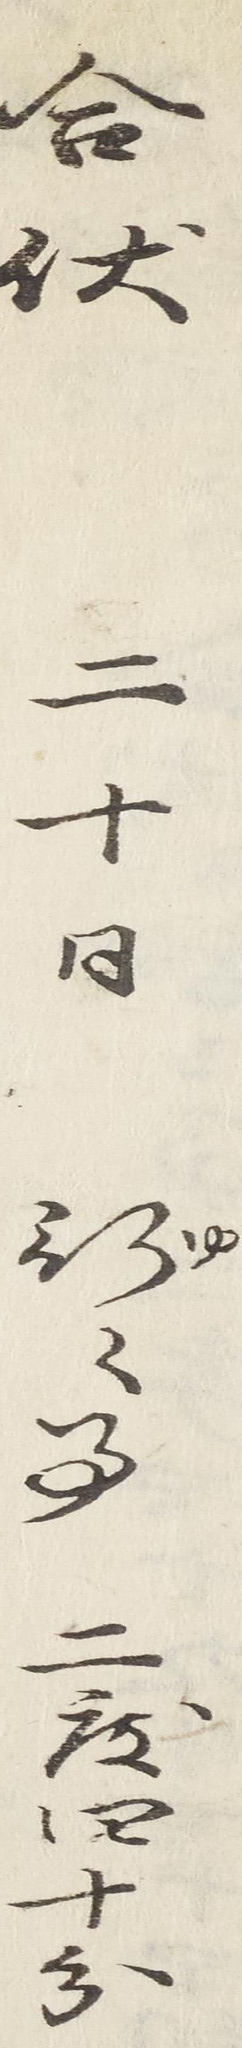合伏二十日行く事二度四十分
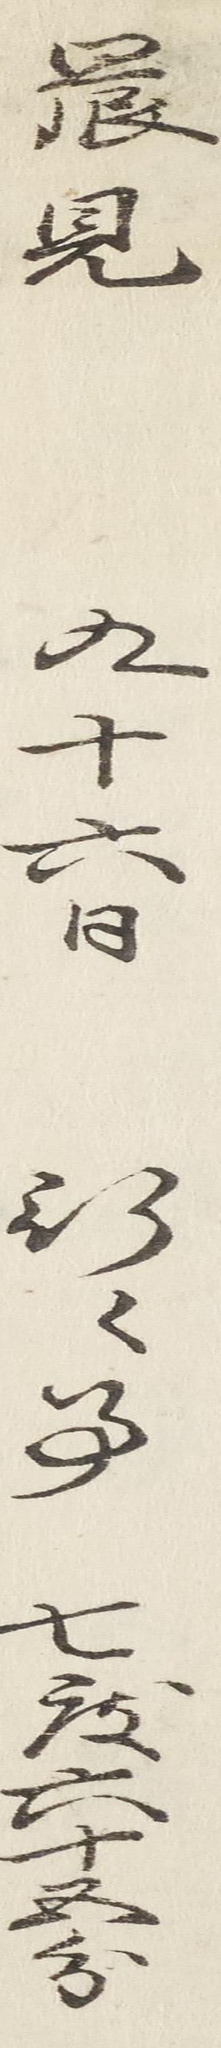晨見九十六日行く事七度六十五分
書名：平天儀圖解
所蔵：東京大学地震研究所図書室 Earthquake Research Institute Library, The University of Tokyo, JAPAN
